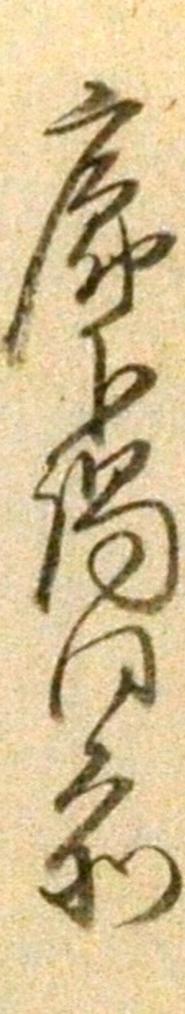廊下謁同前
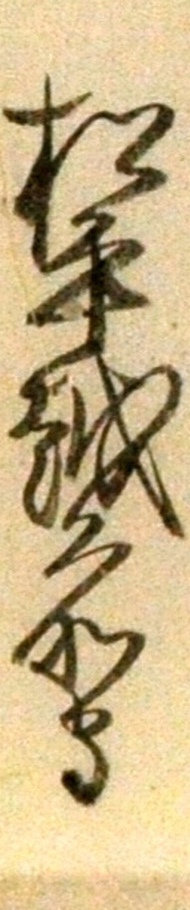松平越前守
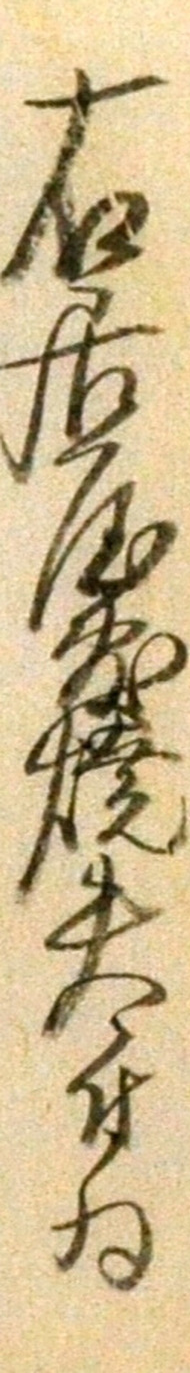右居屋敷焼失ニ付為
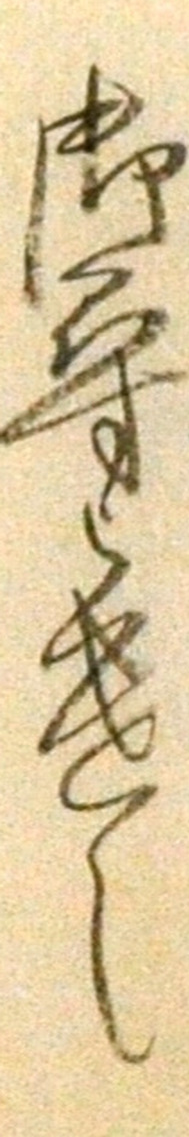御尋被遣之

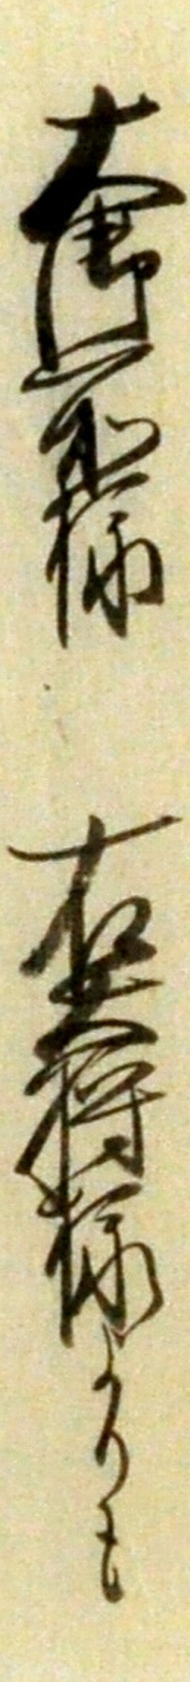大御所様右大将様よりも
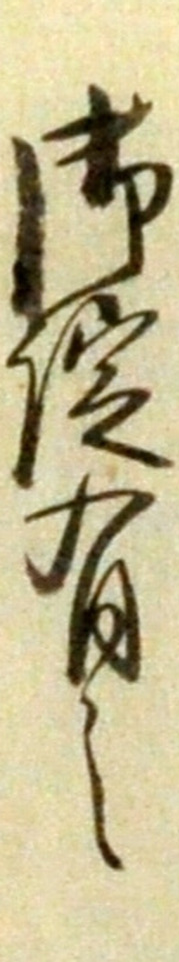御諚有之
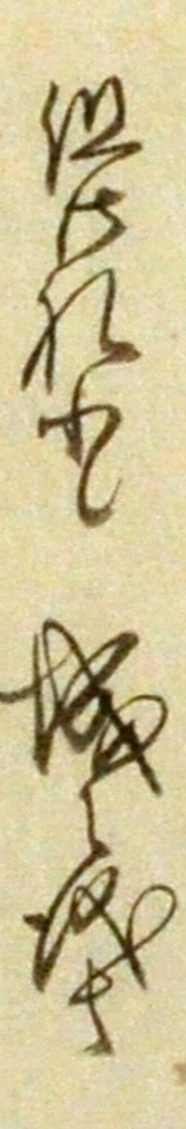但御礼登城之儀
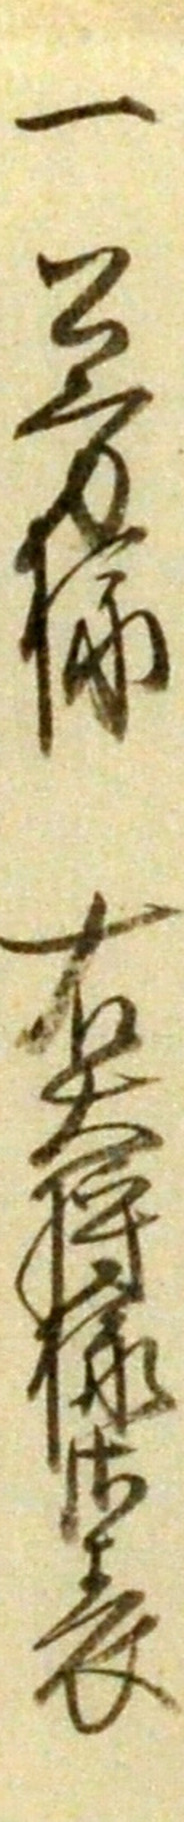一公方様右大将様御表
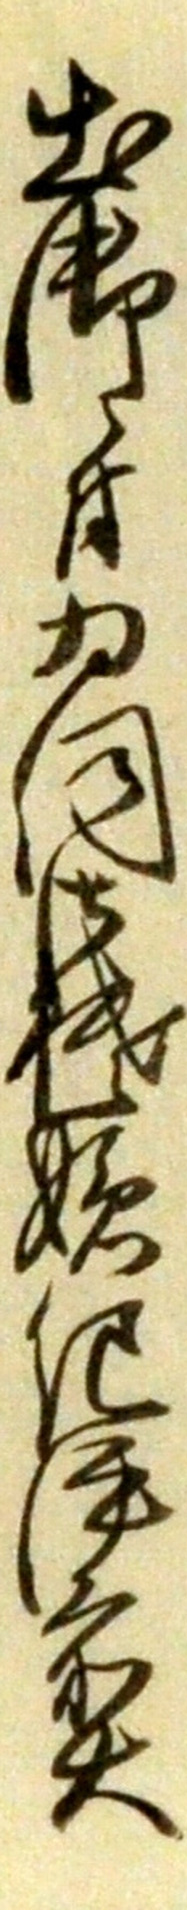出御ニ付為伺御機嫌紀伊前大
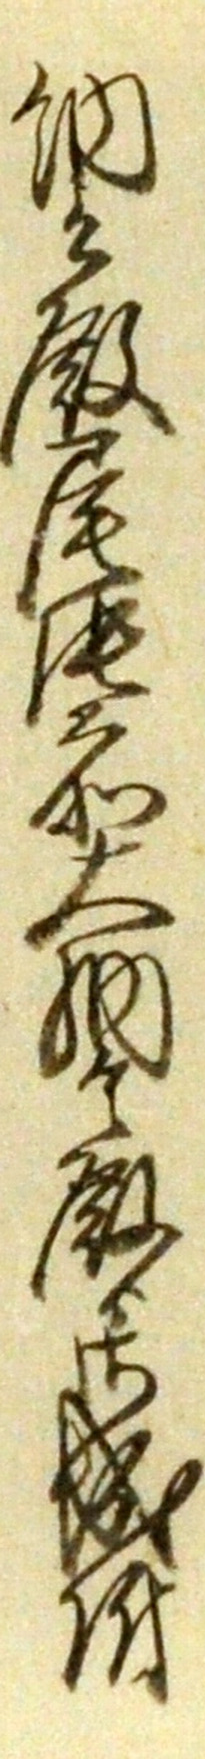納言殿尾張前中納言殿ゟ御城附
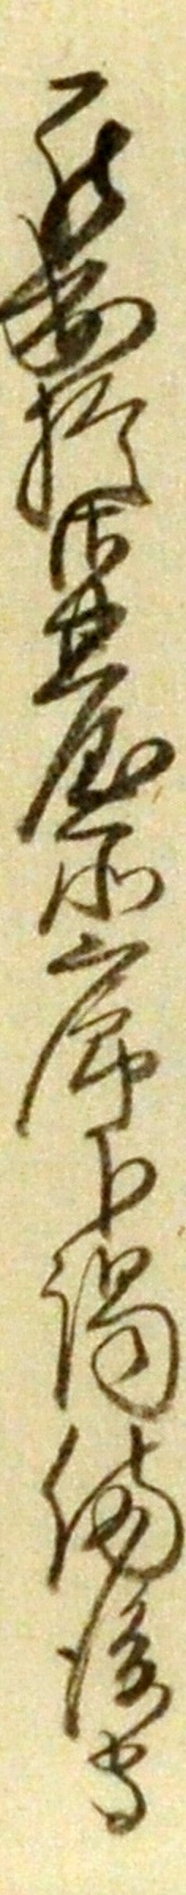罷出於御台所廊下謁備後守
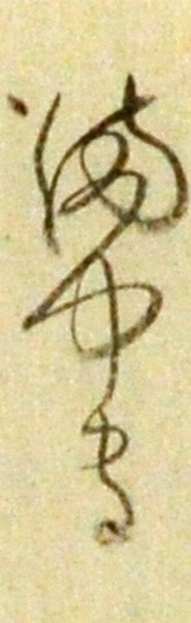備中守
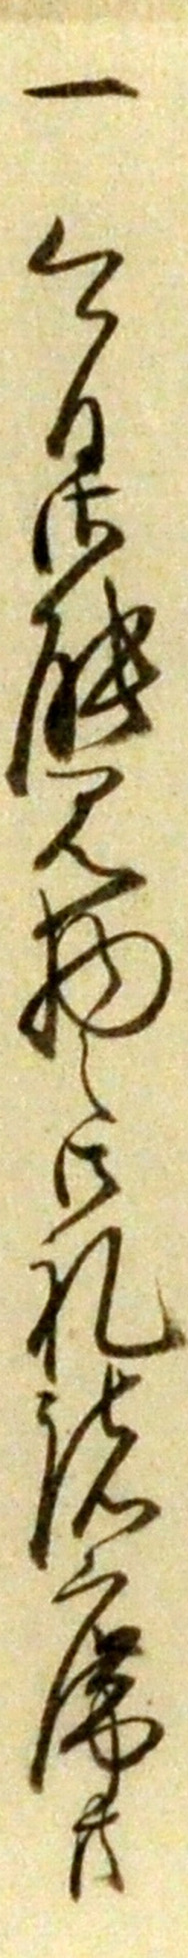一今日御能見物之御礼諸席共
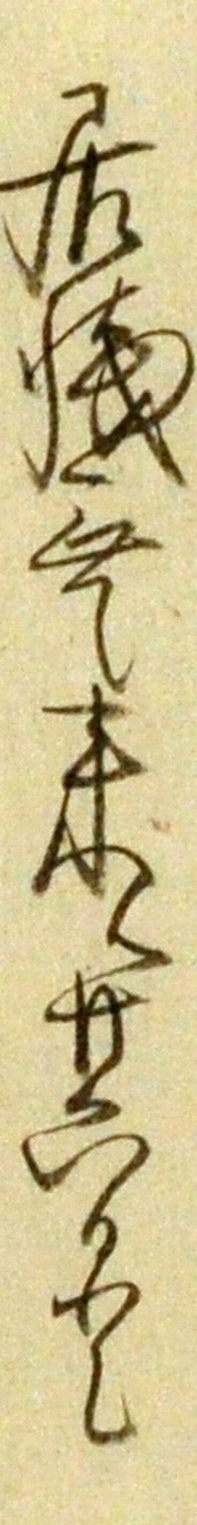居残無之来ル廿六日登
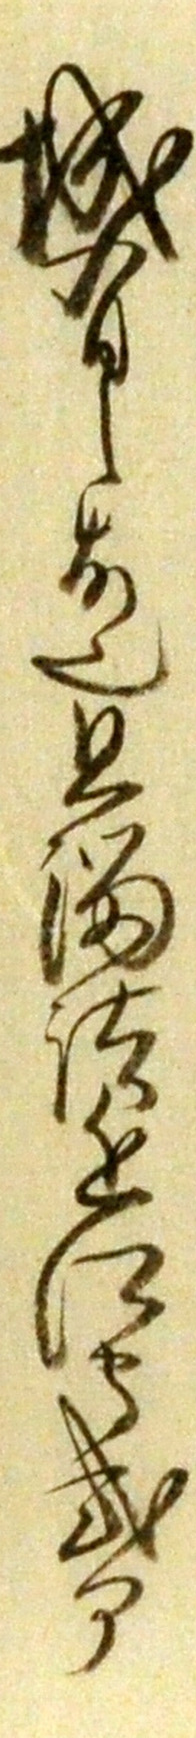城有之故也且溜詰近江守式部
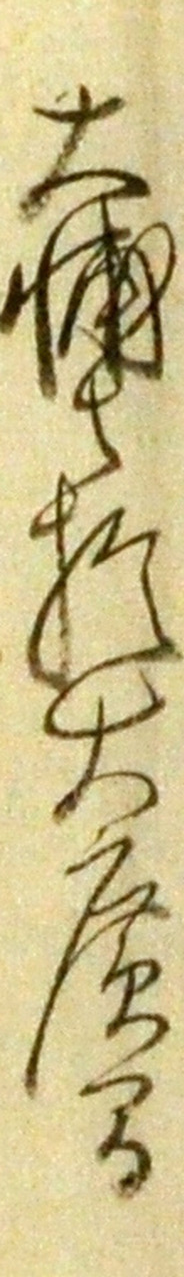大輔は於大広間
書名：御馳走御能ノ節ノ留外
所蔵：伊那市立高遠町図書館・合同会社AMANE
